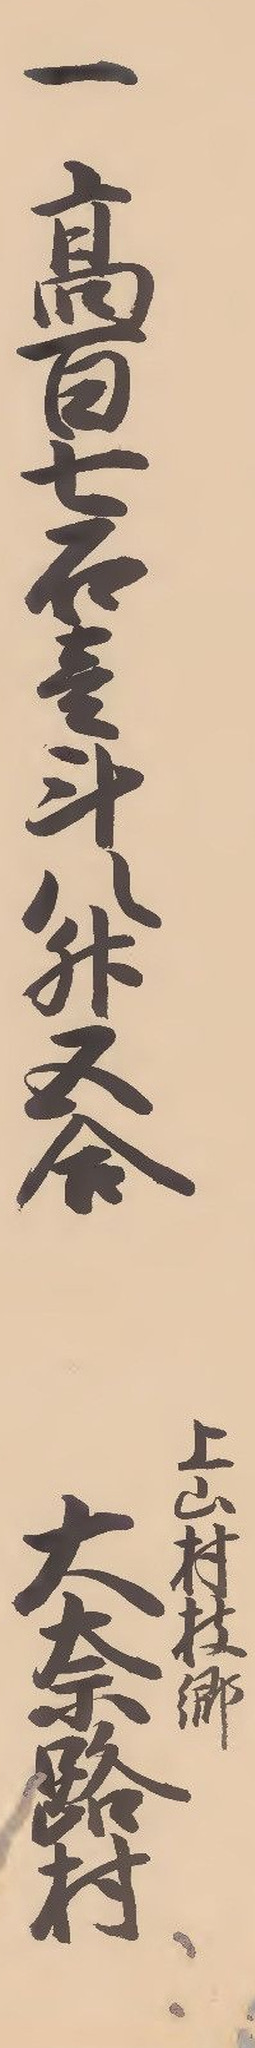一高百七石壱斗八升五合大奈路村

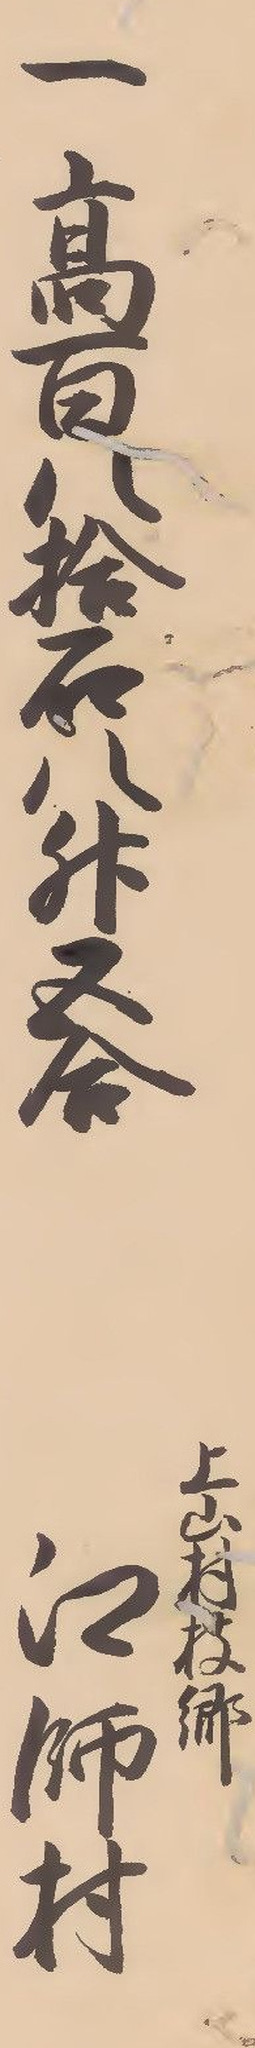一高百八拾石八升五合江師村
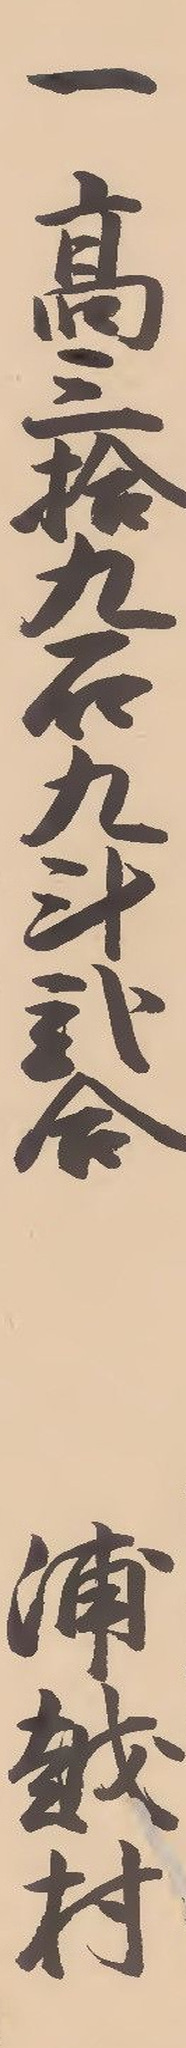一高三拾九石九斗弐合浦越村
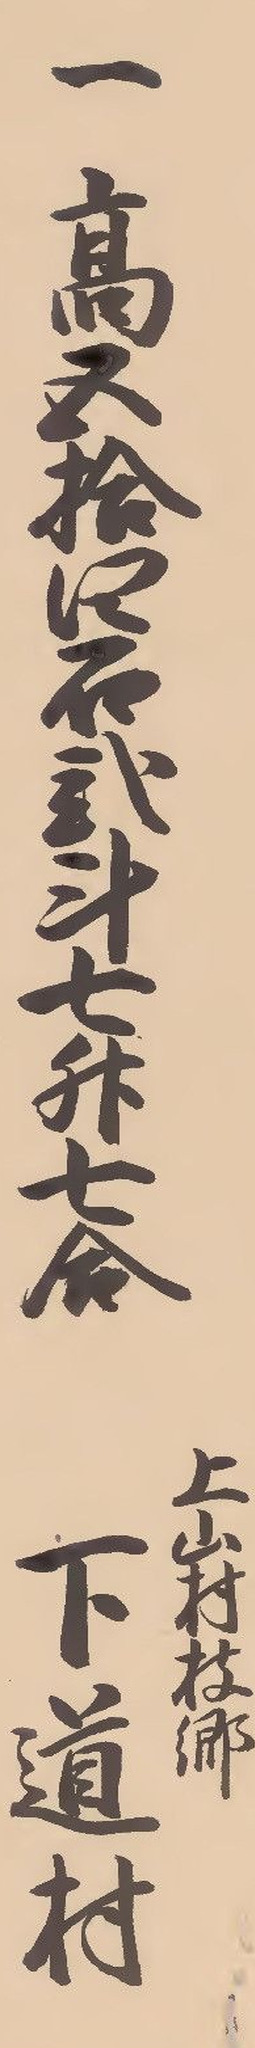一高五拾四石弐斗七升七合下道村
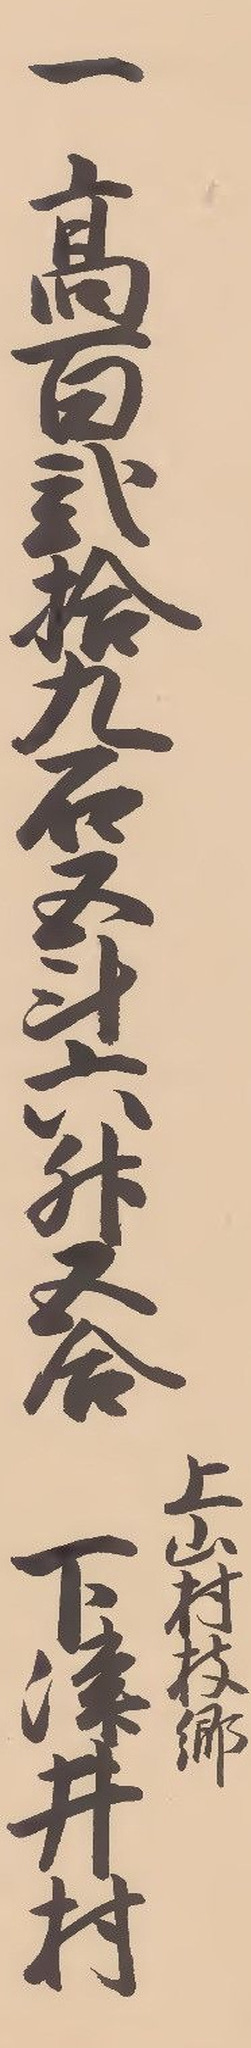一高百弐拾九石五斗六升五合下津井村
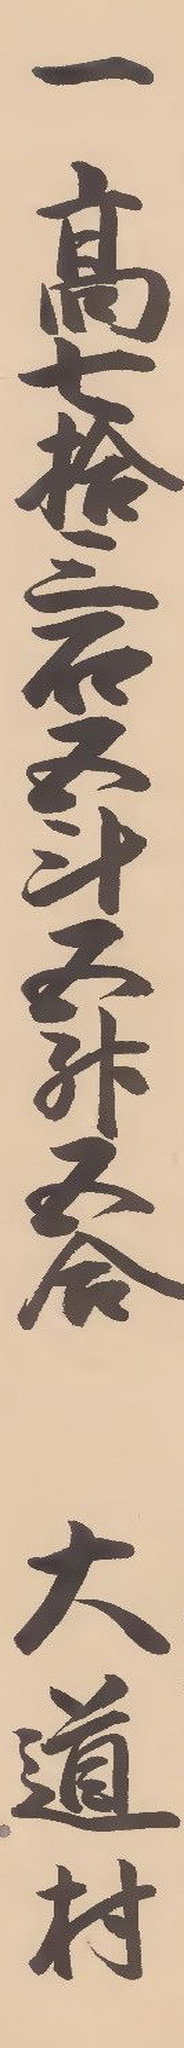一高七拾三石五斗五升五合大道村
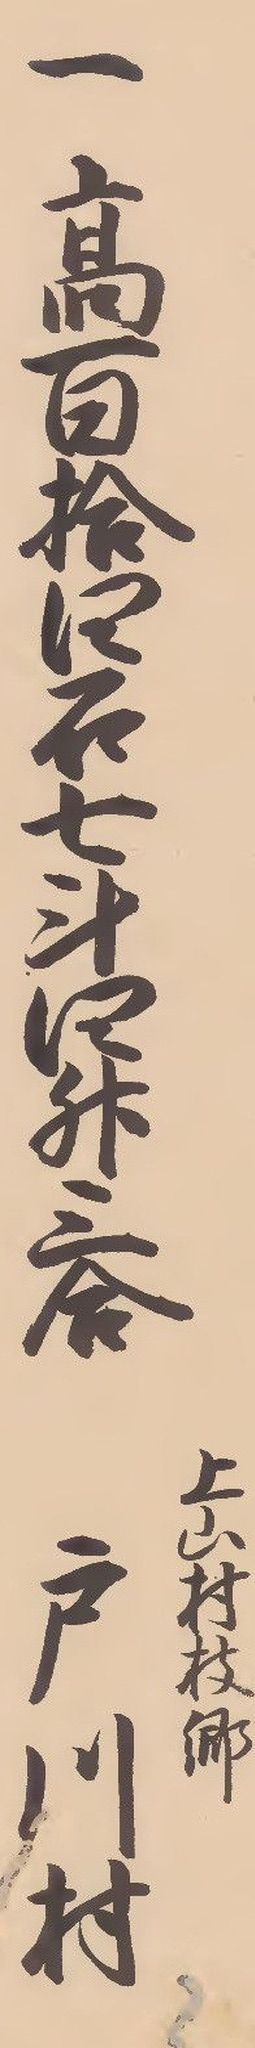一高百拾四石七斗四升三合戸川村
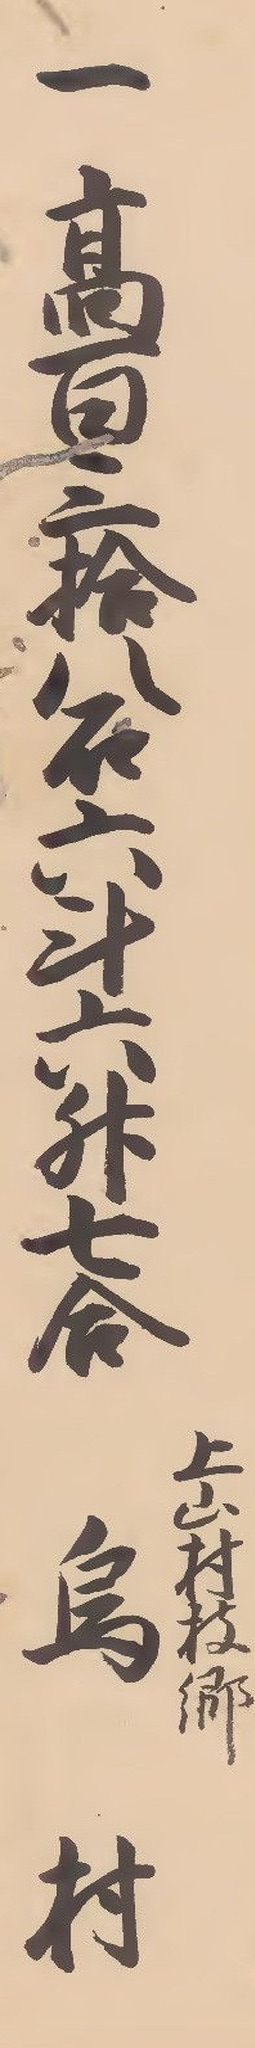一高百三拾八石六斗六升七合烏村

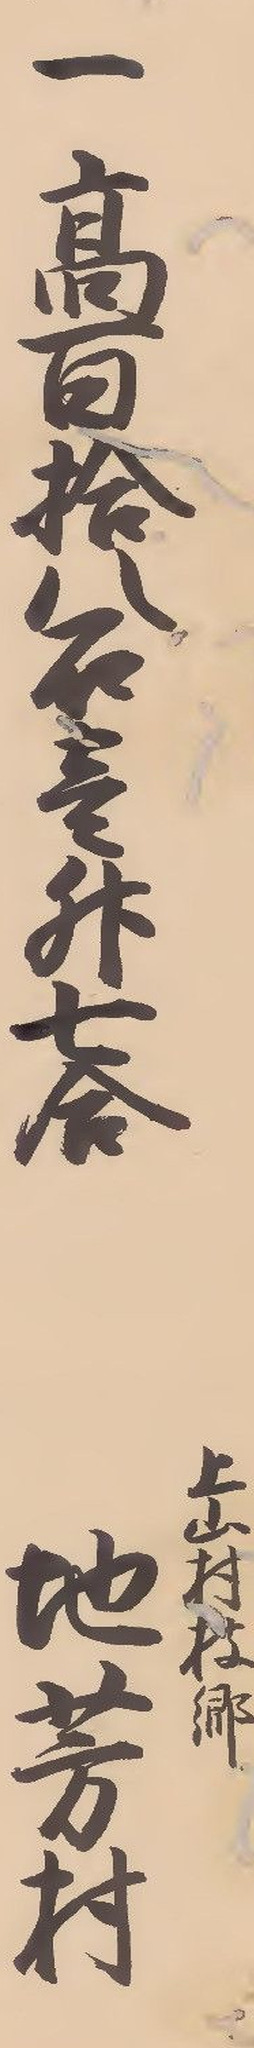一高百拾八石壱升七合地芳村
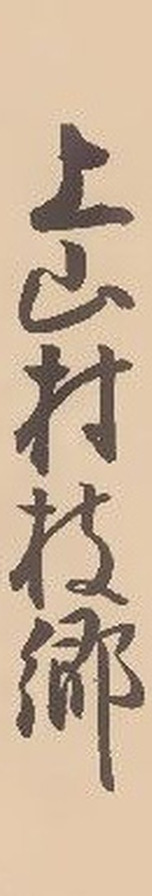上山村枝郷
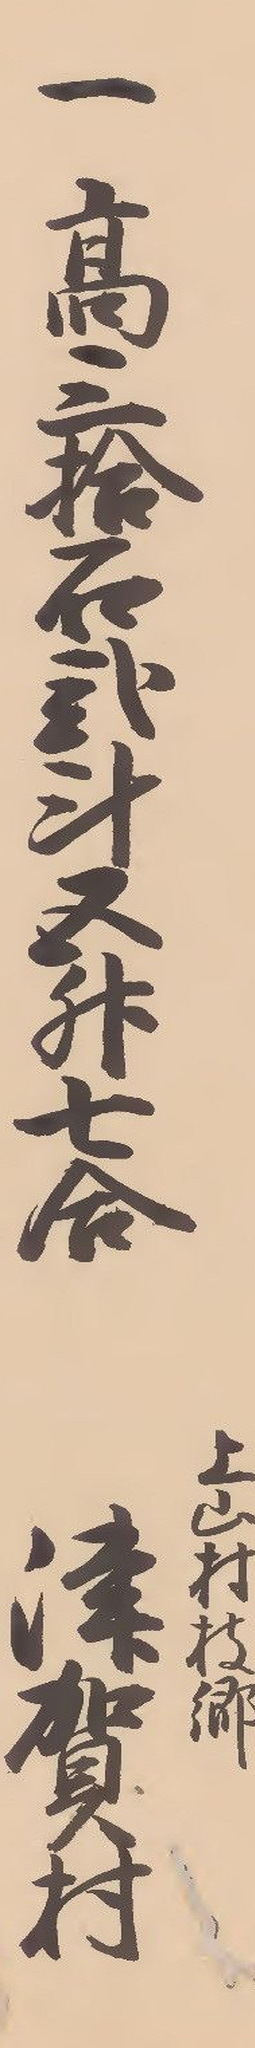一高三拾石弐斗五升七合津賀村
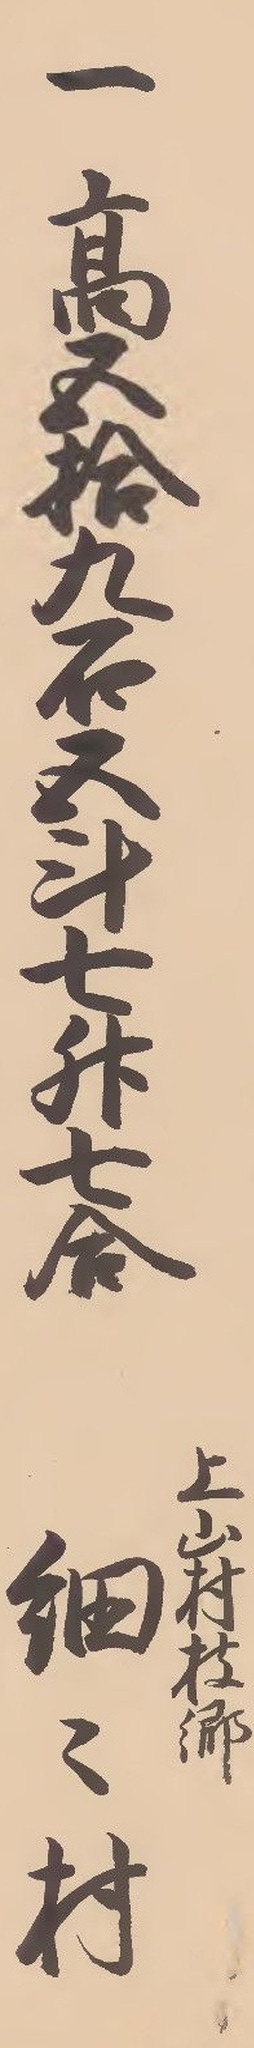一高五拾九石五斗七升七合細々村
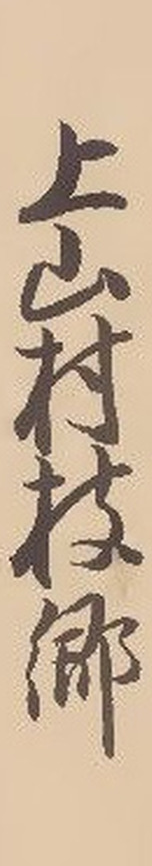上山村枝郷
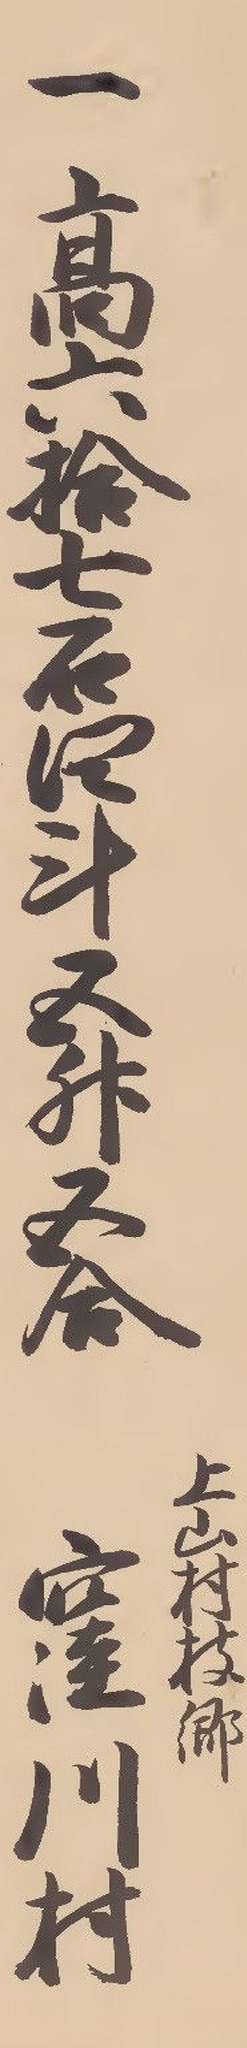一高六拾七石四斗五升五合窪川村
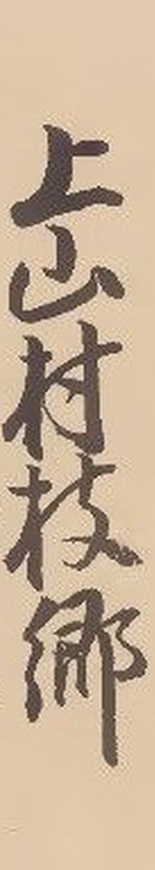上山村枝郷
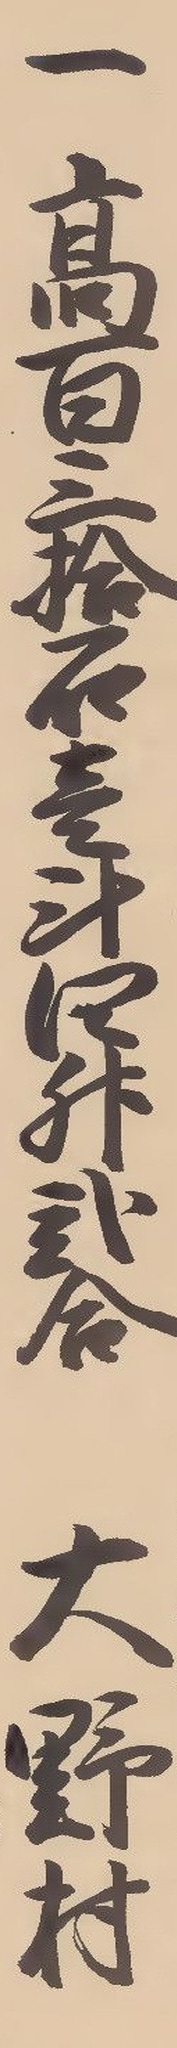一高百三拾石壱斗四升弐合大野村
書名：土佐国郷帳
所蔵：国立公文書館 National Archives of Japan
